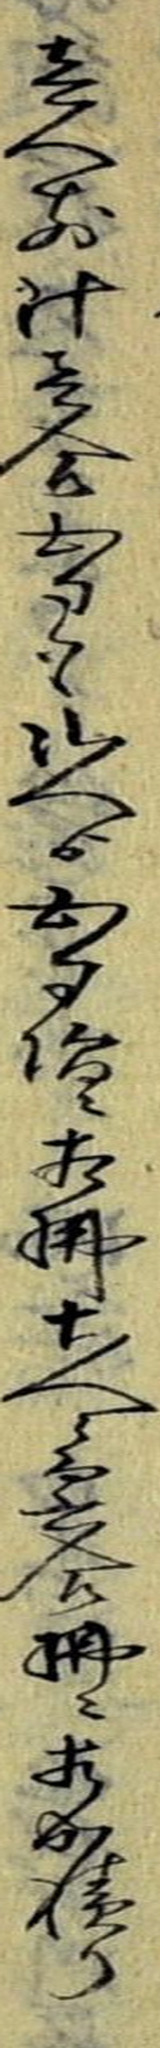壱人前壱合五勺つヽ弐人ゟ五勺増に相払十人に而六合払に相成積り
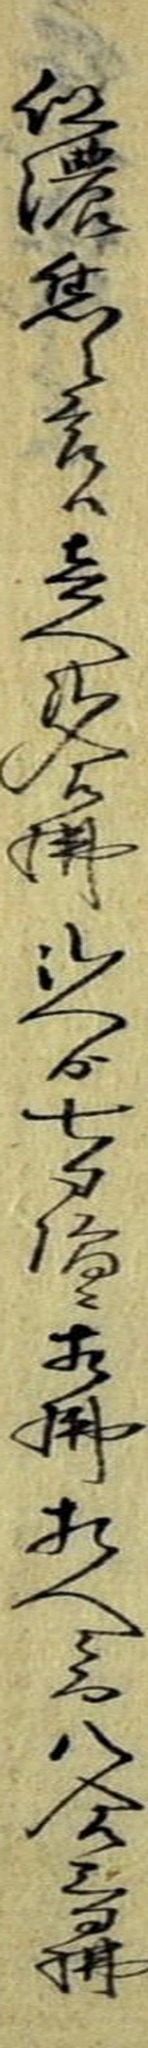但濃焦之節は壱人弐合払弐人ゟ七勺増に相払拾人に而八合三勺払
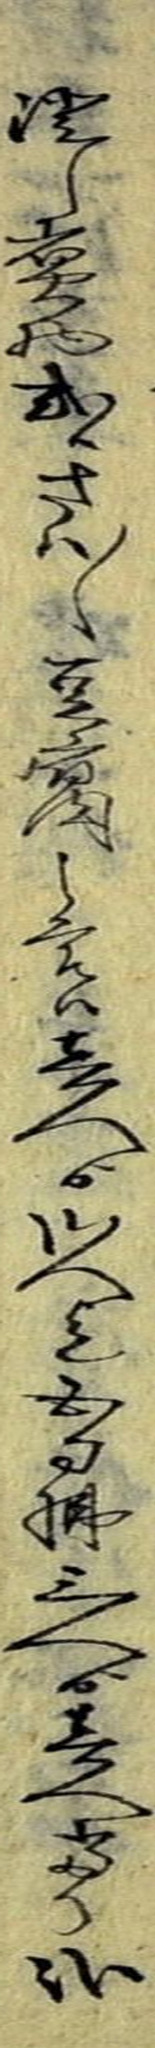澄之煮物或はさは〳〵豆腐之節は壱人ゟ弐人迄五勺払三人ゟ壱人当り弐勺
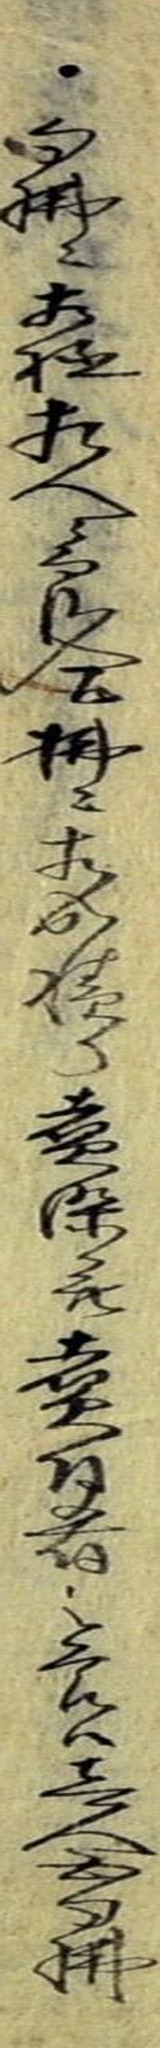に相極拾人に而弐合払に相成積り煮染并煮付肴之節は壱人五勺払
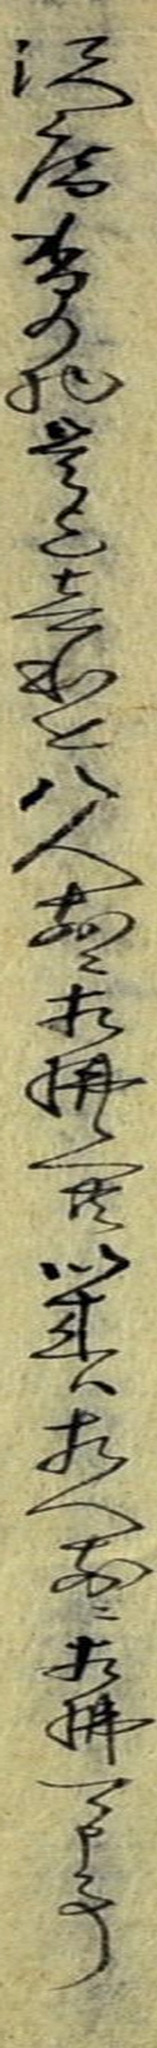沢庵香の物是迄壱本を八人に相払候へ共以来は拾人前に相払可申事
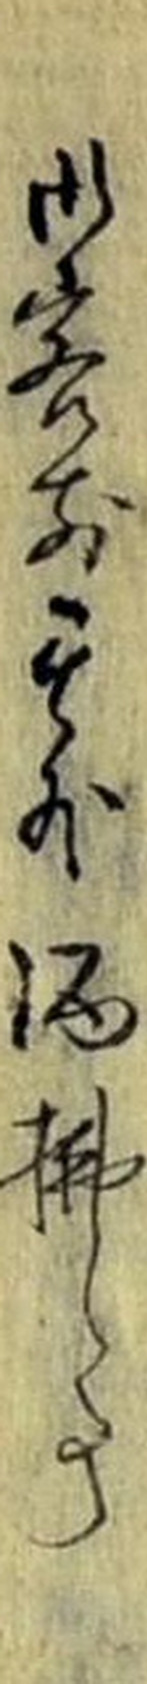御客於其外酒払之事
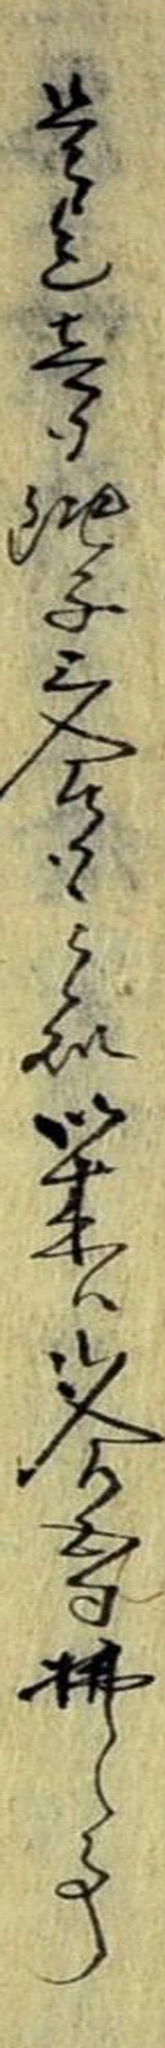是迄一つ銚子三合ッヽに候処以来は弐合五勺払之事
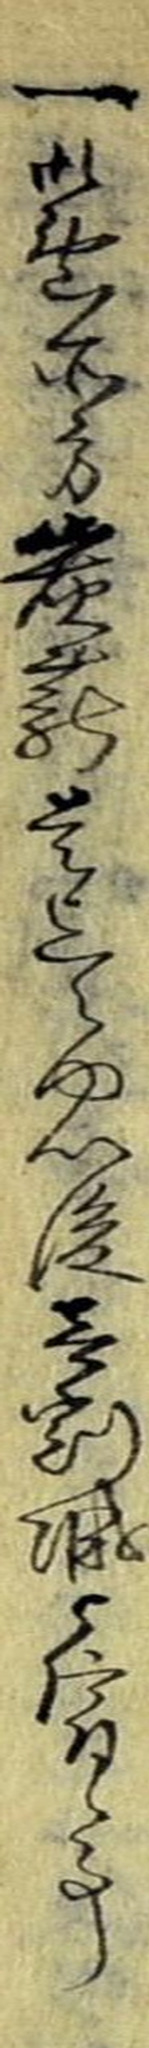一御台所方炭薪是迄之内以後壱割減被仰付候事
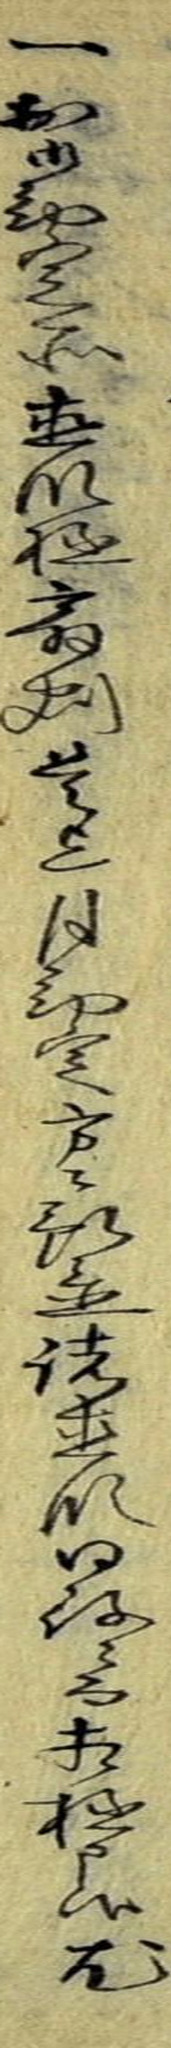一於御勘定所直段極裏判是迄月勘定方に預置諸直段同役に而相極申候尤
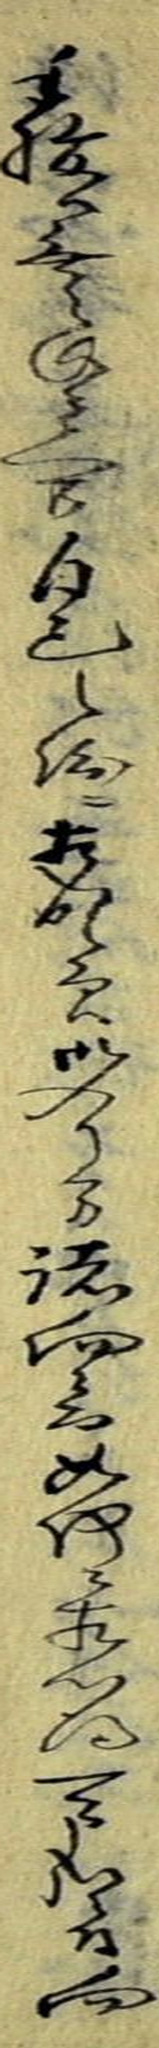手腹は無之趣に候へ共自己之儀に相成候而は御〆り方諸向に而如何に相心得可申哉に付向

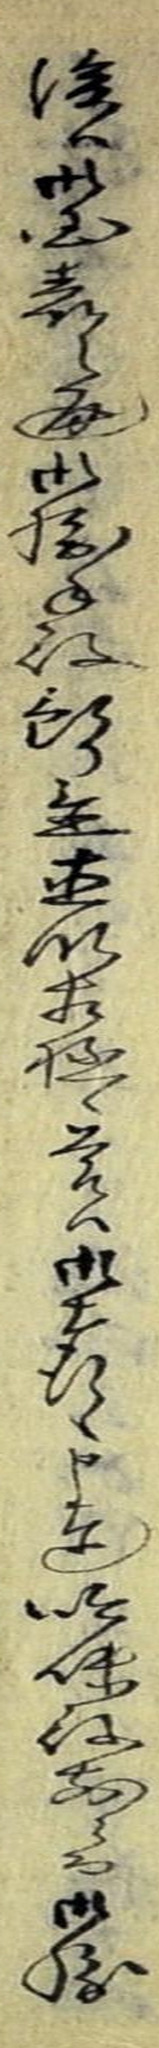後は御国表之通御勝手役預り置直段相極候節は御奉行へ申達吟味役前に而御勝
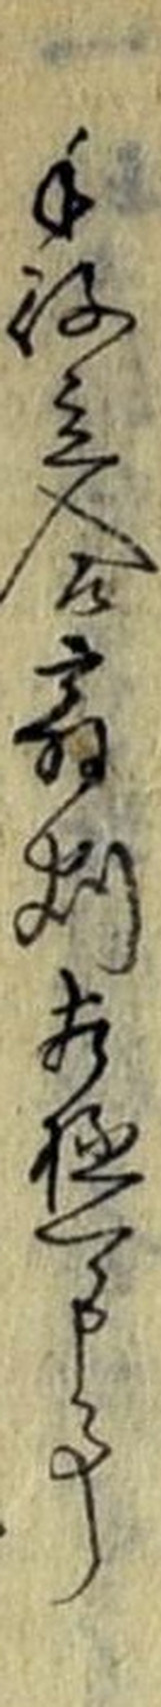手役立合裏判相極可申事
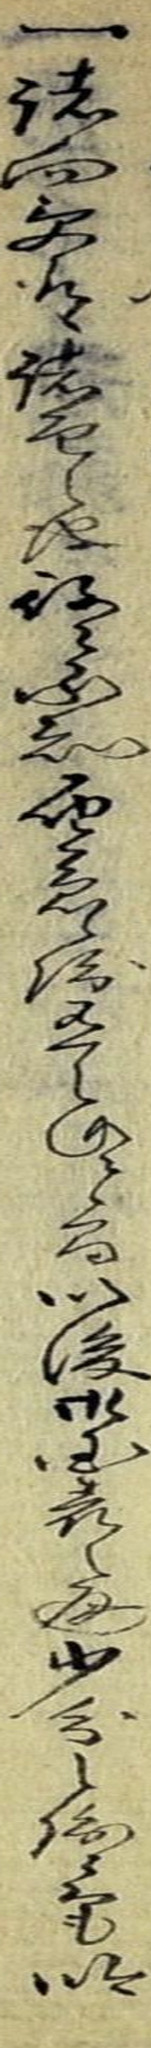一諸向受取候諸色之儀役々承知届兼候儀有之趣に候間以後御国表之通少分之儀に而も吟
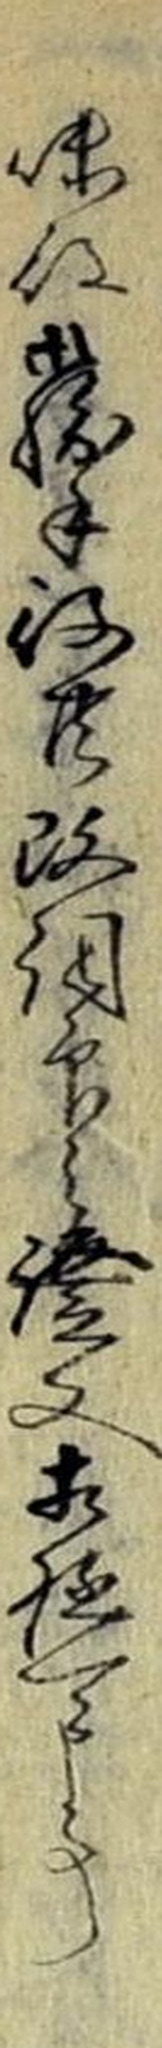味役御勝手役共改調印之証文相極可申事
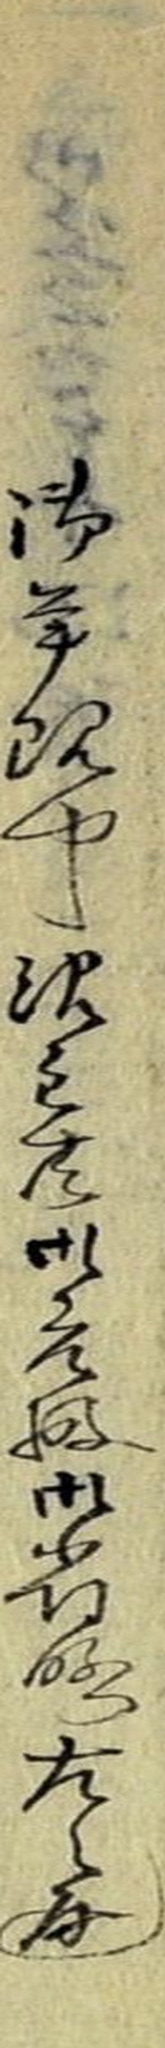御年限中銀主共御取扱御省略左之通
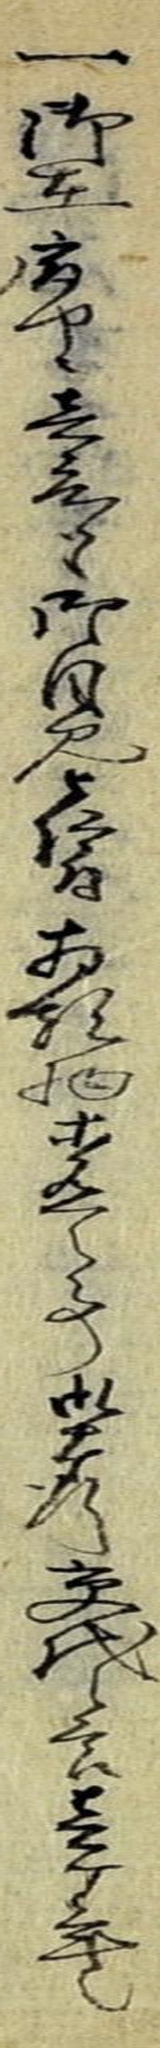一御在府中壱度つヽ御目見被仰付拝領物等有之事御奉行交代之節壱ヶ年之
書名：命令之部 四
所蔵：福井県文書館 Fukui Prefectural Archives
